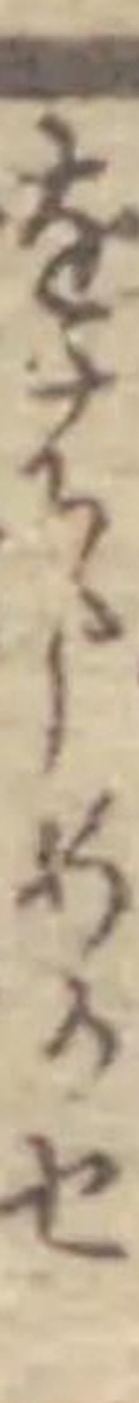をはじめかせ
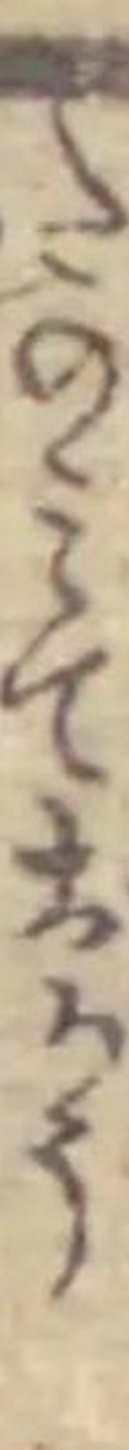たのみておかう
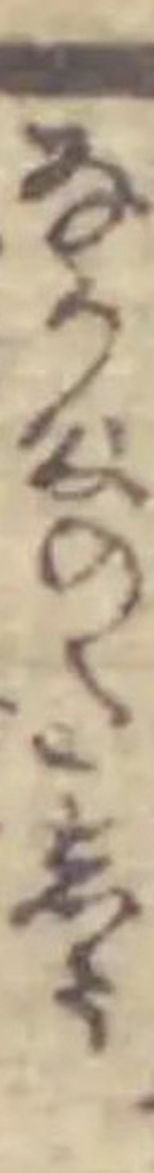なかまのたしう
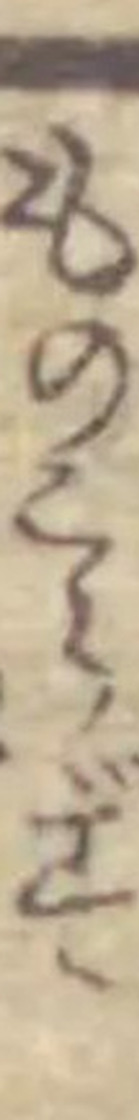ものこらず
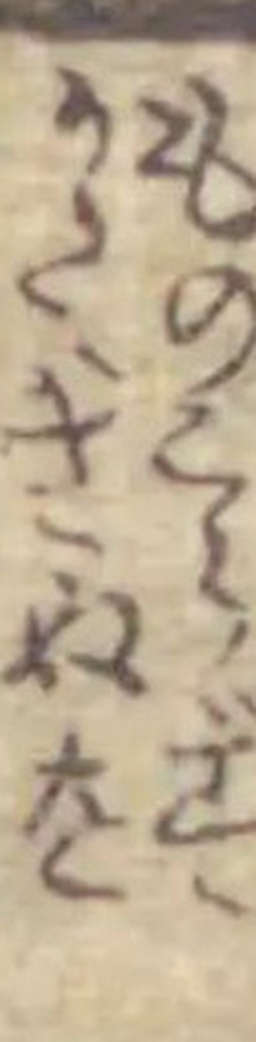かたきぬを
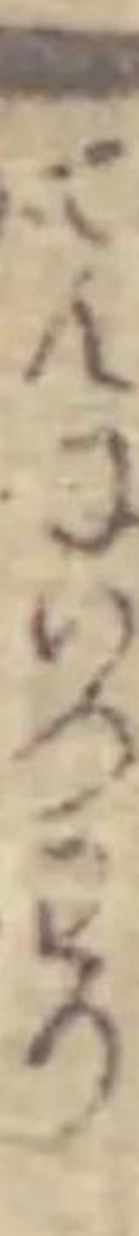てんにいつわり
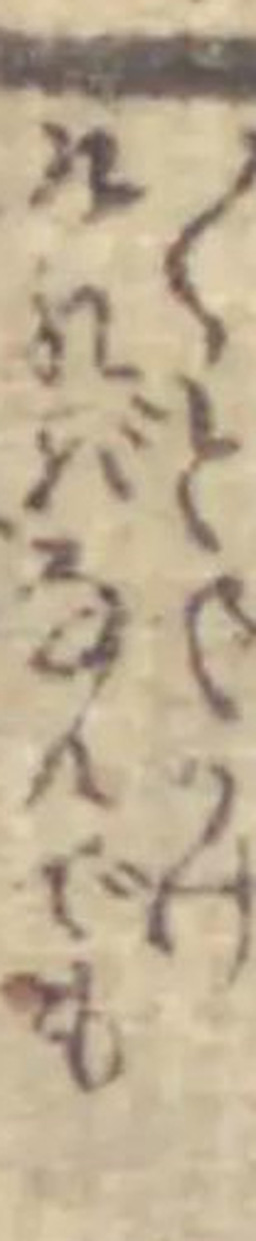ければなんでも
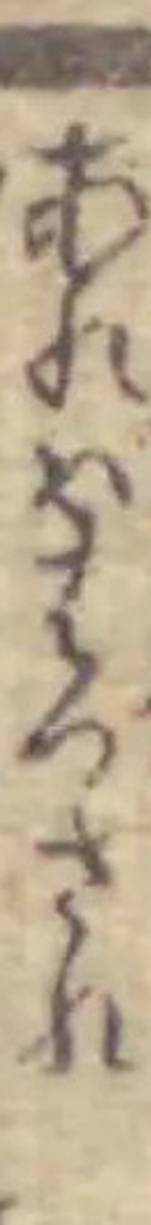あればはつされ
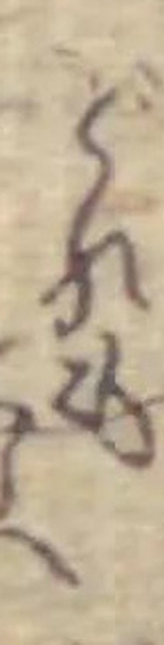どれも
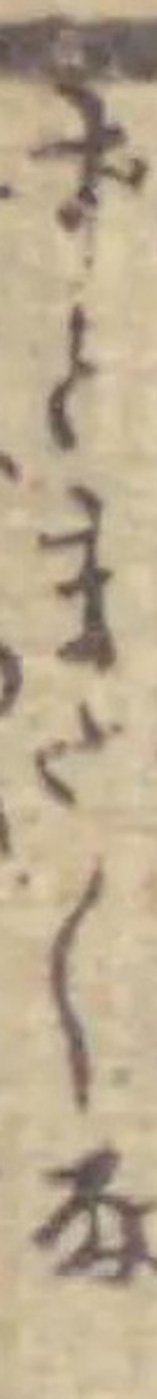ずとまた〳〵雨
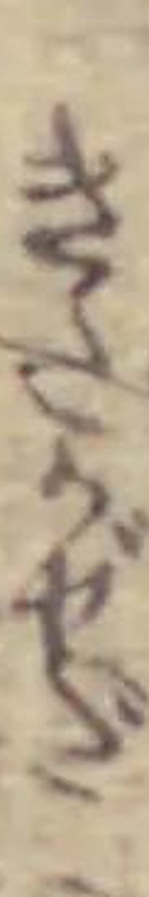きたかぜだ
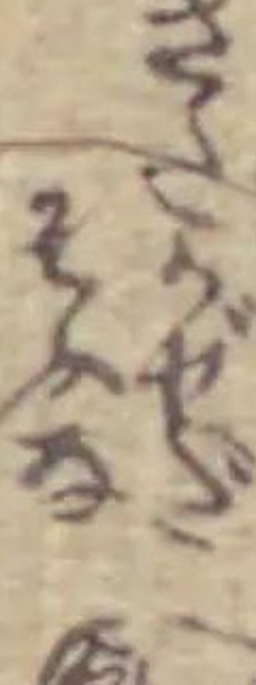そふな
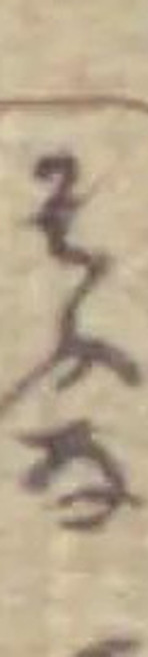そふな
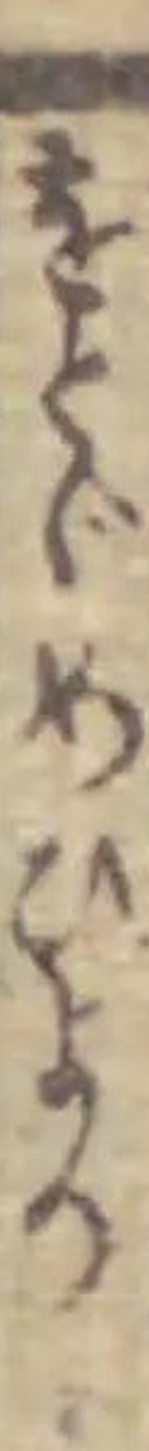をとゞめひより
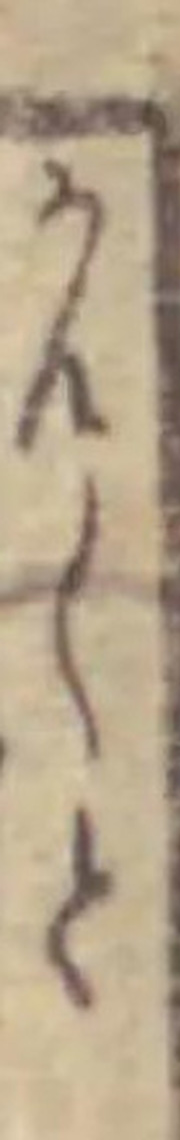かん〳〵と
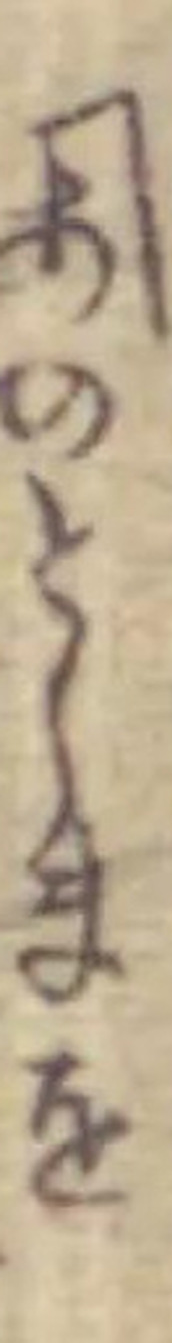〽あのとしまを
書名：雨宮風宮出儘略縁記 3巻
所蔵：国立国会図書館 National Diet Library, JAPAN
